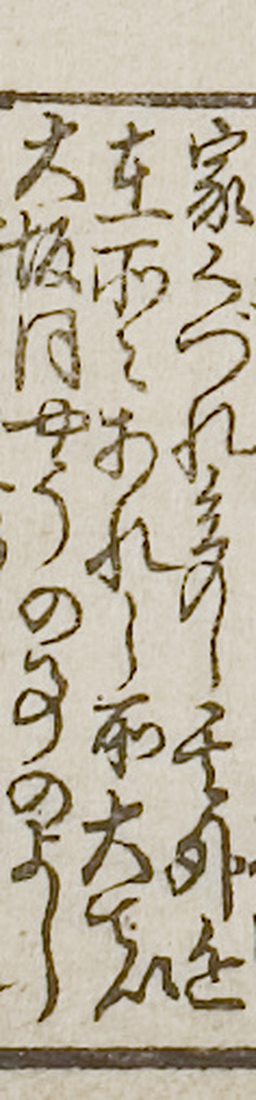在所々あれし所大てい
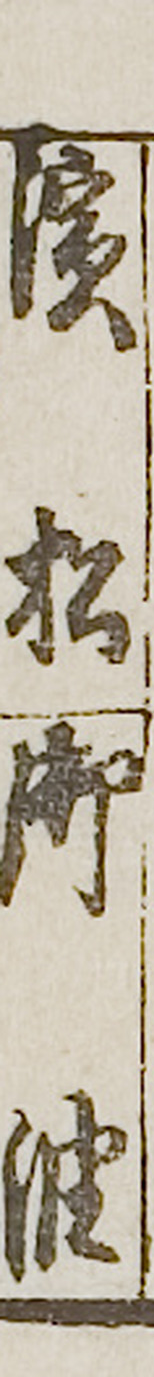浜松御油
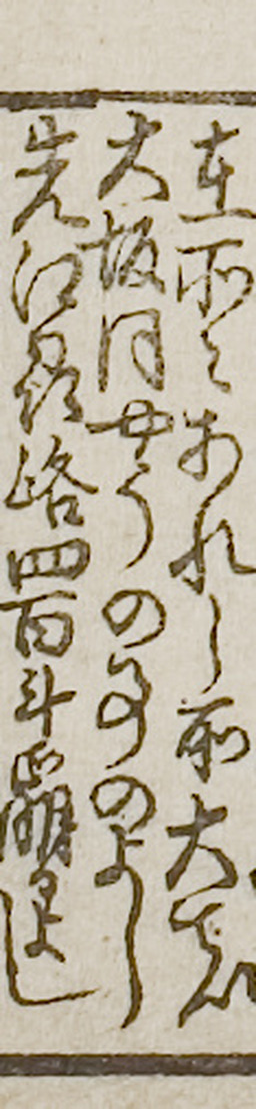大坂同やうの事のよし
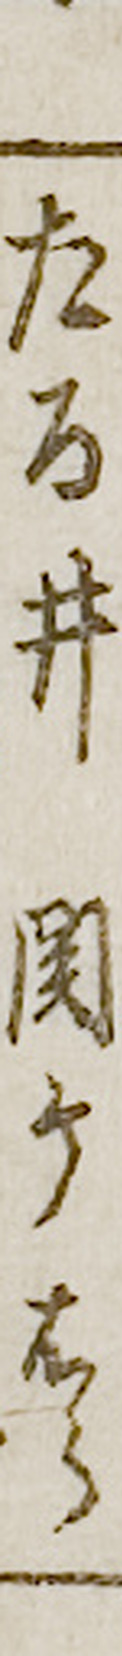たる井関ケはら
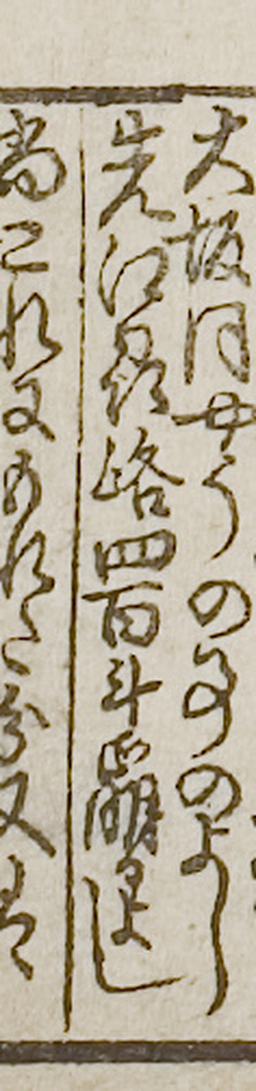先江州路四百斗崩るよし
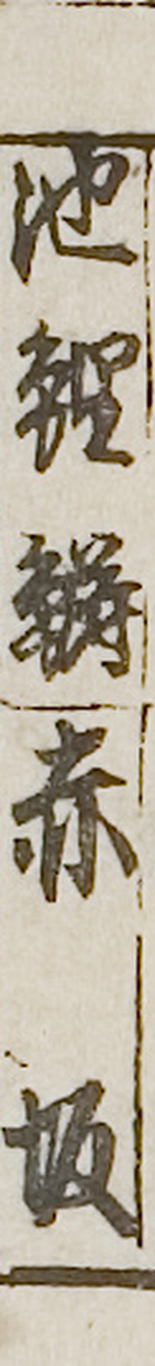池鯉鮒赤坂
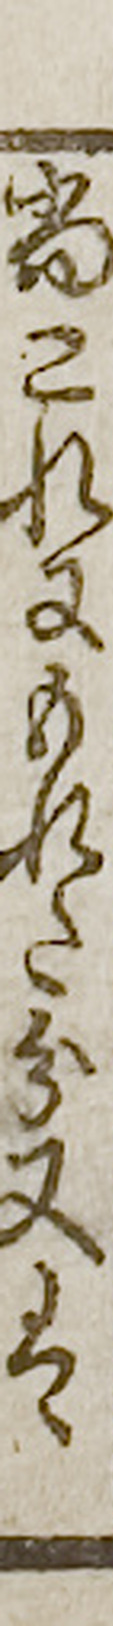尚これにもれた分又は
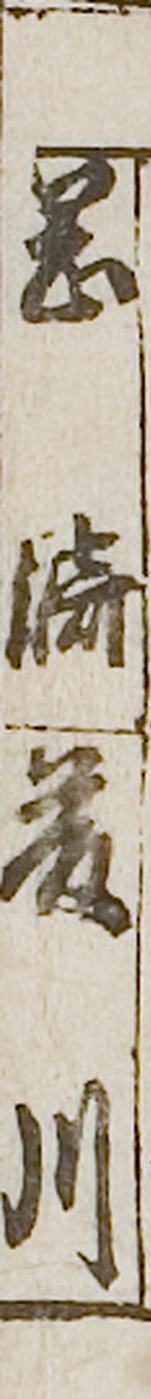岡崎藤川
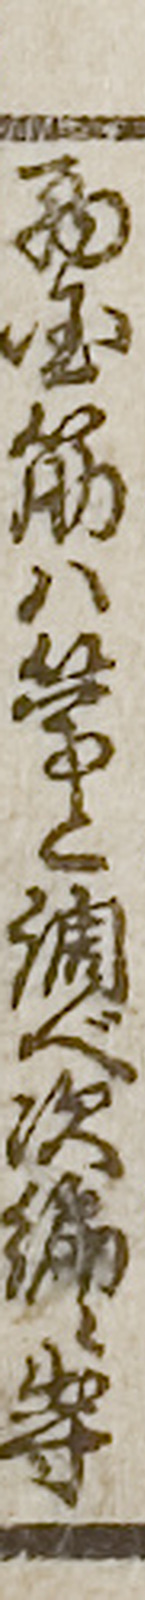西国筋は篤と調べ次編に出す
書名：大阪大地震一覧
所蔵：東京大学総合図書館 General Library in the University of Tokyo, JAPAN
